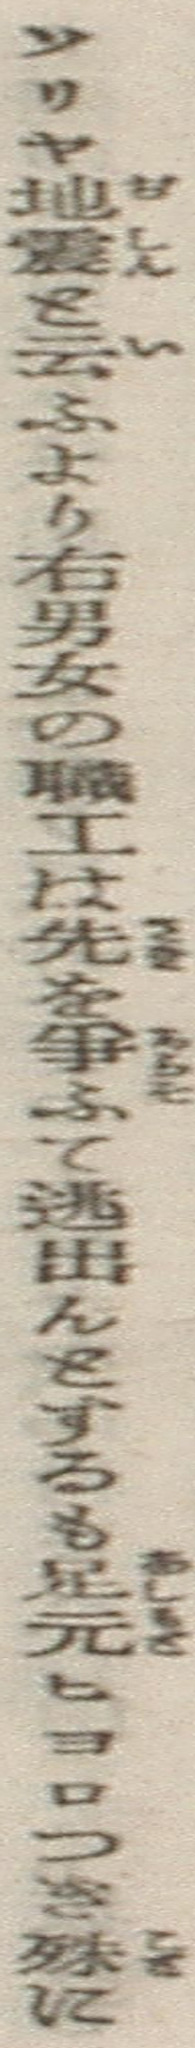ソリヤ地震と云ふより右男女の職工は先を争ふて逃出んとするも足元ヒヨロつき殊に
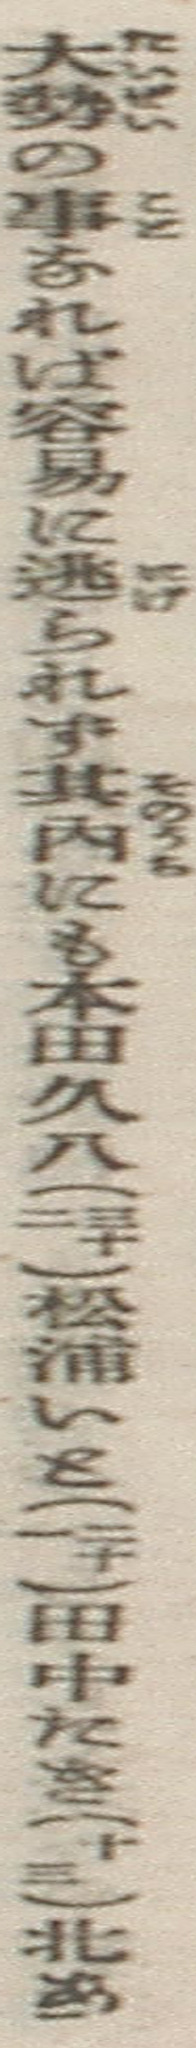大勢の事なれば容易に逃られず其内にも本多久八松浦いと田中たき北あ

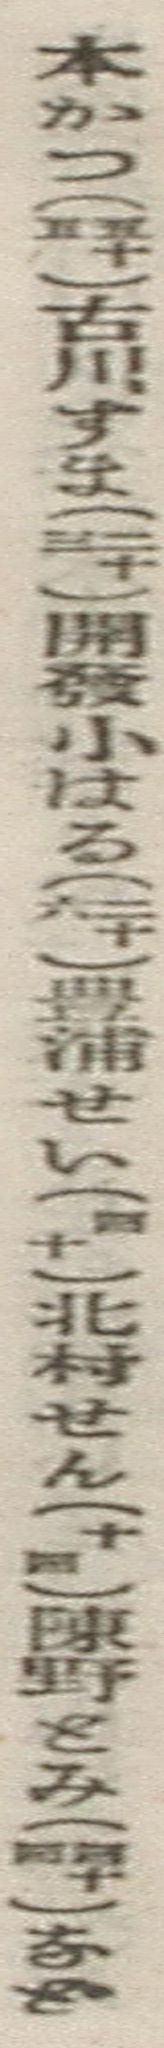本かつ古川すま開発小はる豊浦せい北村せん陳野とみなど
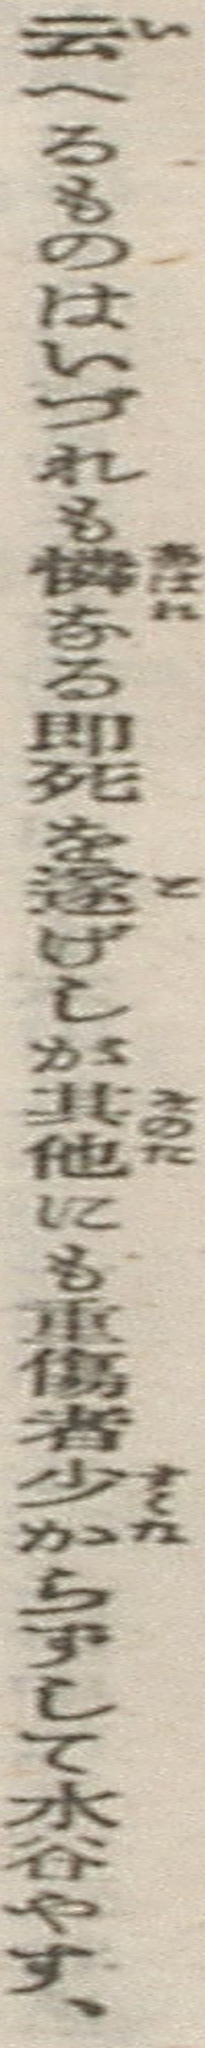云へるものはいづれも憐なる即死を遂げしが其他にも重傷者少からずして水谷やす、
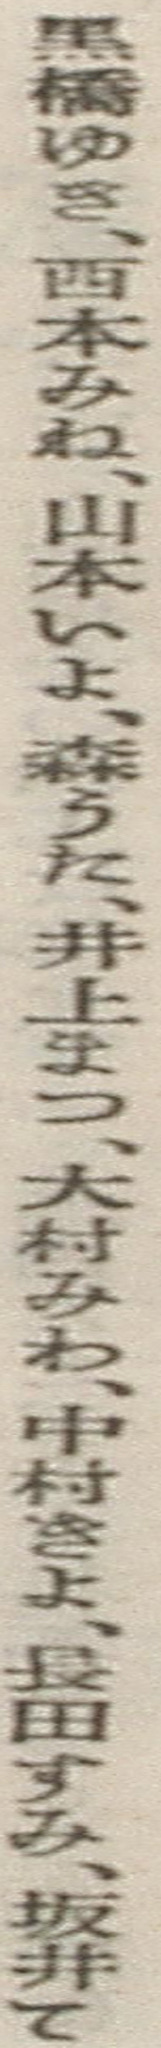黒橋ゆき、西本みね、山本いよ、森うた、井上まつ、大村みわ、中村きよ、長田すみ、坂井て
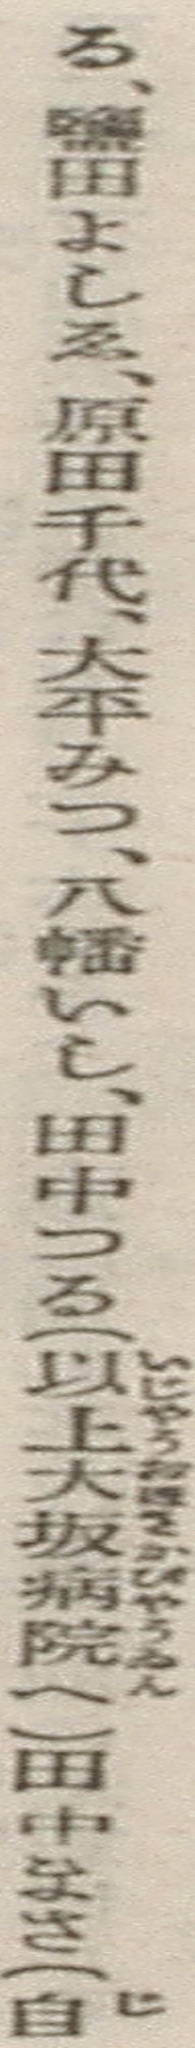る、鹽田よしゑ、原田千代、大平みつ、八幡いし、田中つるへ）田中まさ
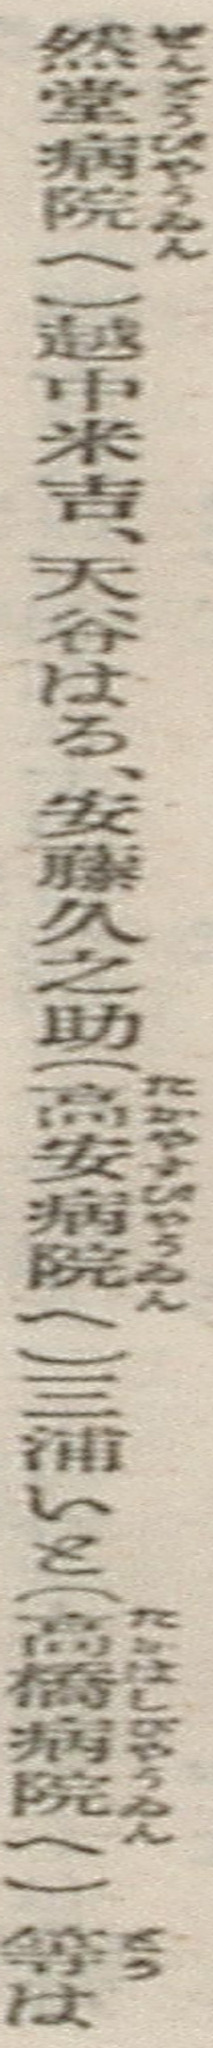然堂病院へ）越中米吉、天谷はる、安藤久之助へ）三浦いとへ）等は
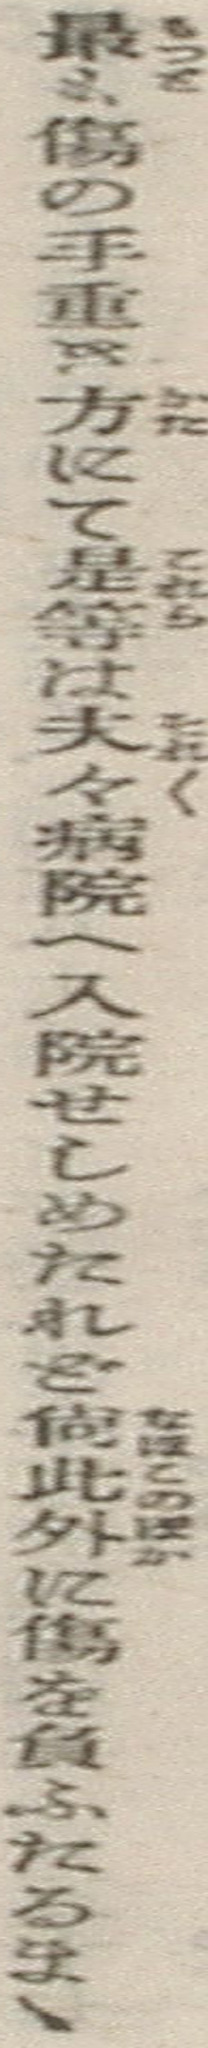最も傷の手重き方にて是等は夫々病院へ入院せしめたれど尚此外に傷を負ふたるまゝ
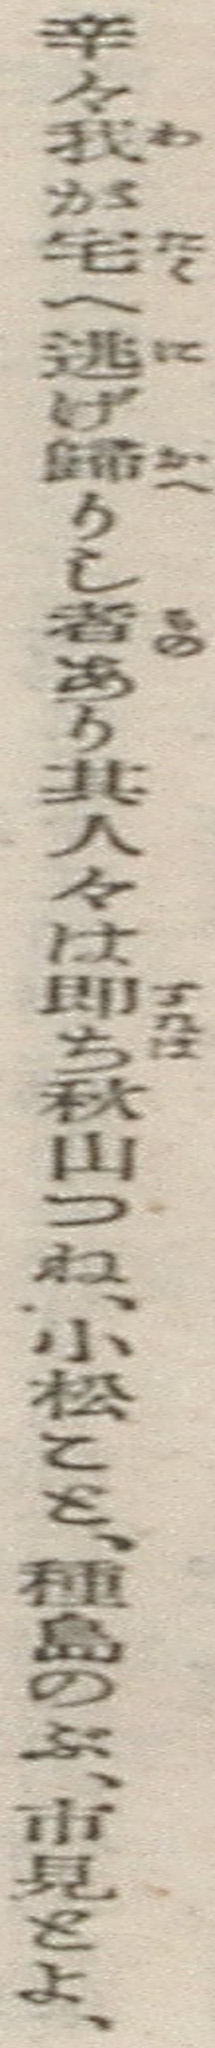辛々我が宅へ逃げ歸りし者あり其人々は即ち秋山つね、小松こと、種島のぶ、市見とよ、
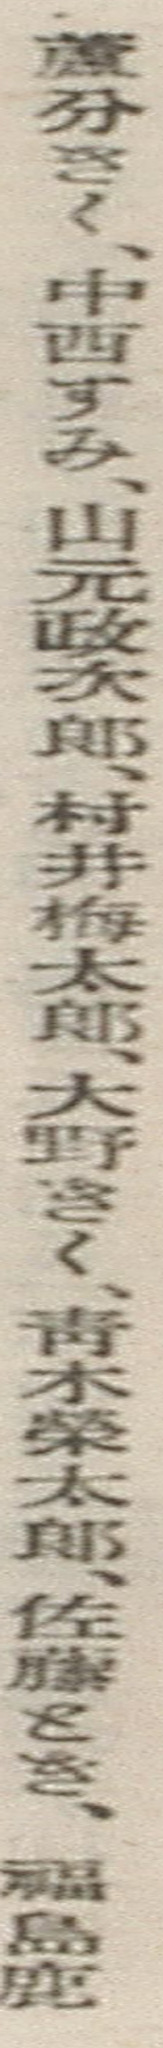蘆分きく、中西すみ、山元政次郎、村井梅太郎、大野きく、青木栄太郎、佐藤とき、福島鹿
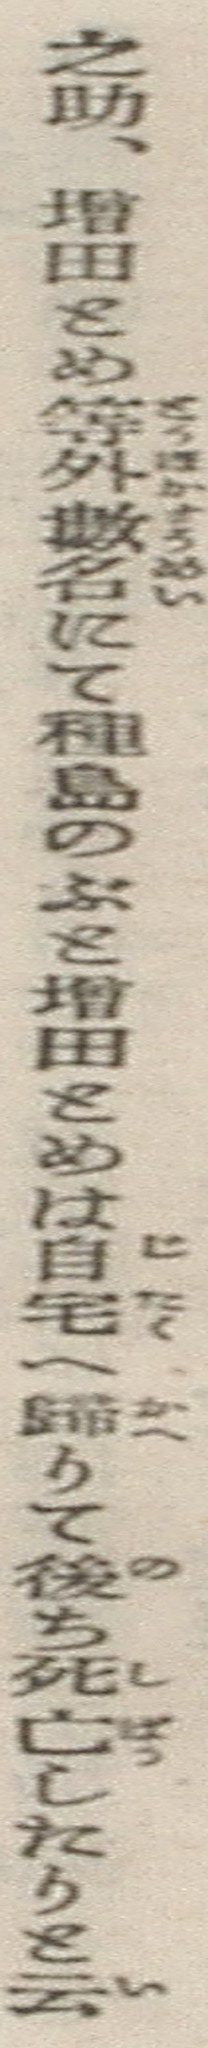之助、増田とめ等外数名にて種島のぶと増田とめは自宅へ帰りて後ち死亡したりと云
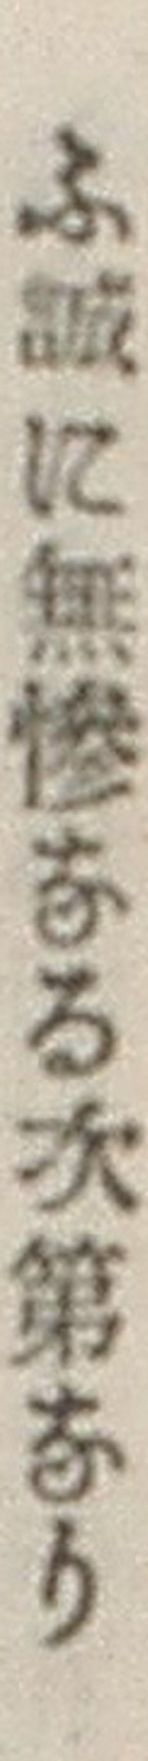ふ誠に無惨なる次第なり
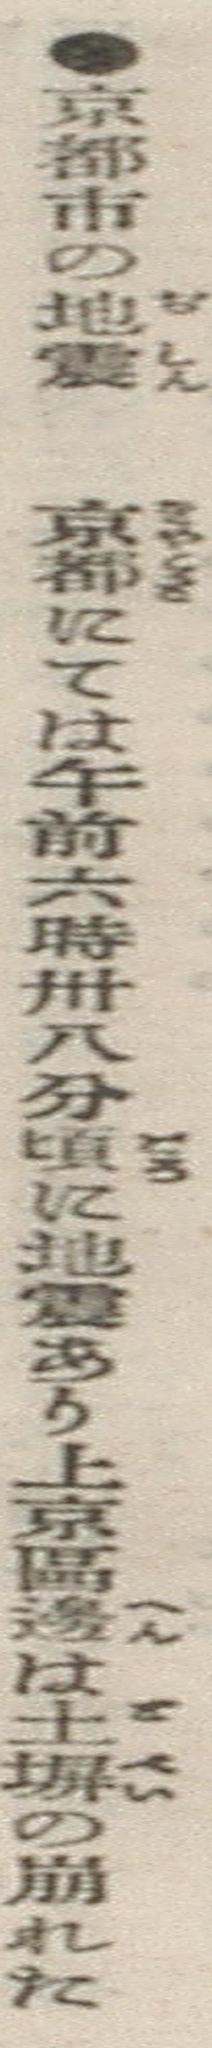●京都市の地震京都にては午前六時卅八分頃に地震あり上京区邊へんは土塀の崩れた
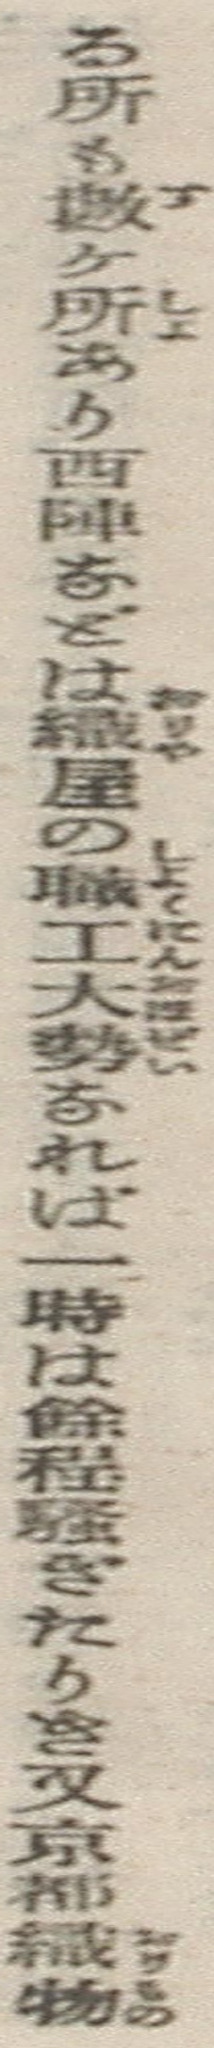る所も数ヶ所あり西陣などは織屋の職工大勢なれば一時は餘程騒ぎたりき又京都織物おりもの
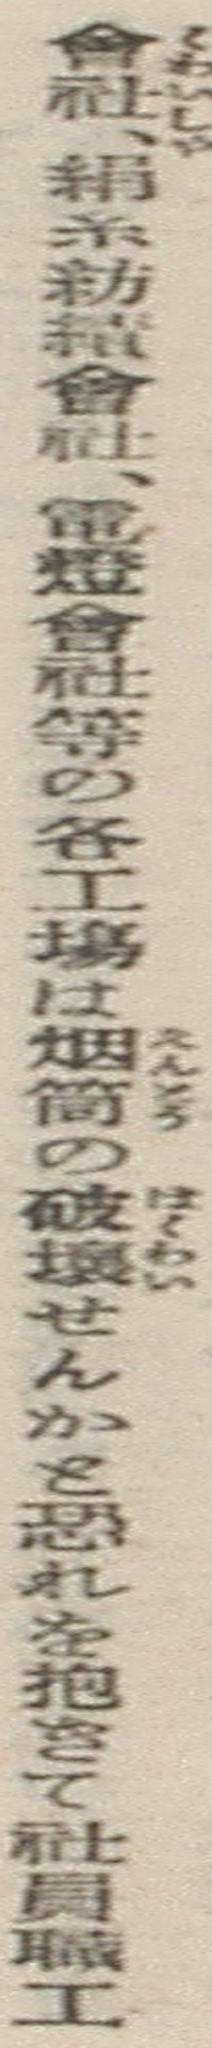會社、絹糸紡績會社、電燈會社等の各工場は烟筒の破壊せんかと恐れを抱きて社員職工
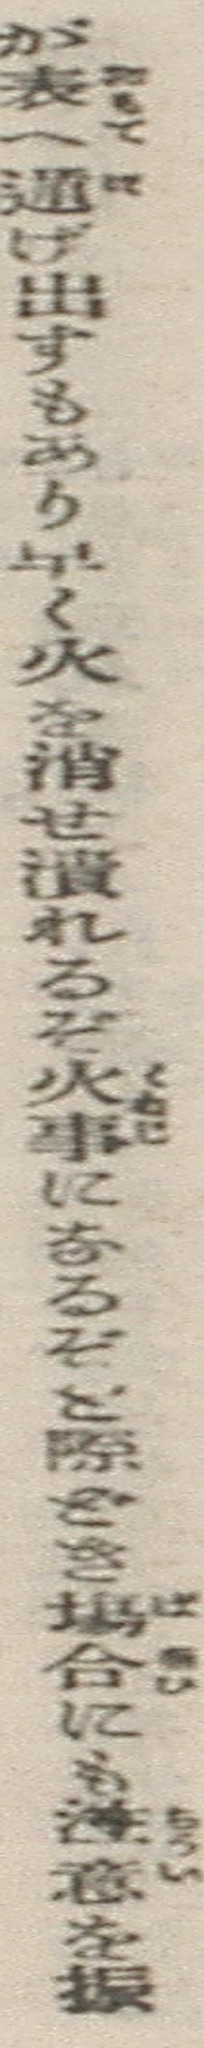が表へ逃げ出すもあり早く火を消せ潰れるぞ火事になるぞと際どき場合にも注意を振
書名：愛知岐阜福井三県　大地震見聞録（内題）
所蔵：東京大学地震研究所図書室 Earthquake Research Institute Library, The University of Tokyo, JAPAN
